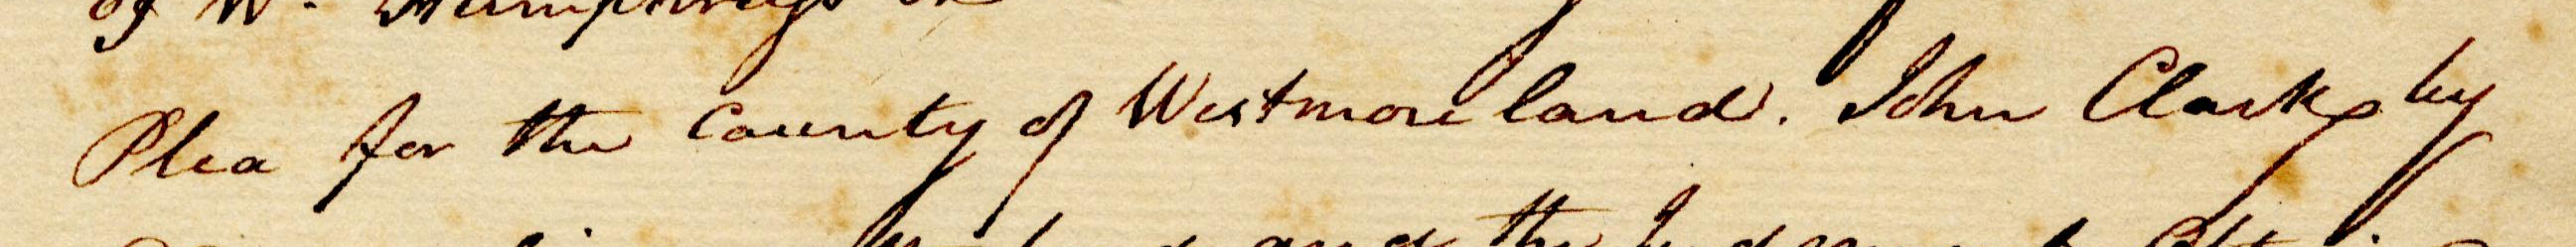Pea for the County of Westmoreland: John Clark by
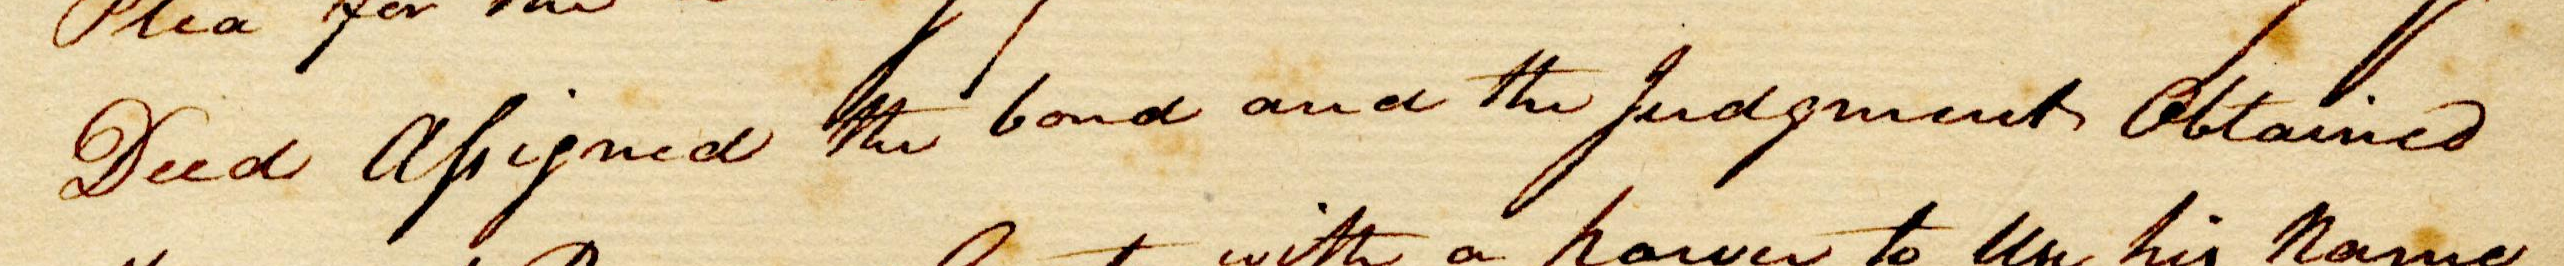Deed assigned the bond and the judgment obtained
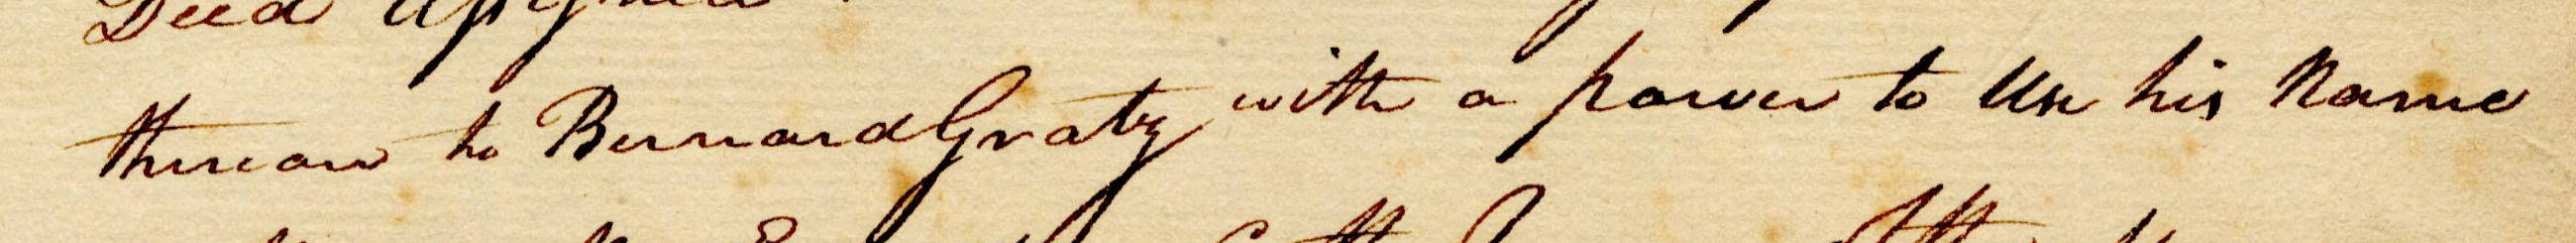thereon to Bernard Gratz with a power to use his Name
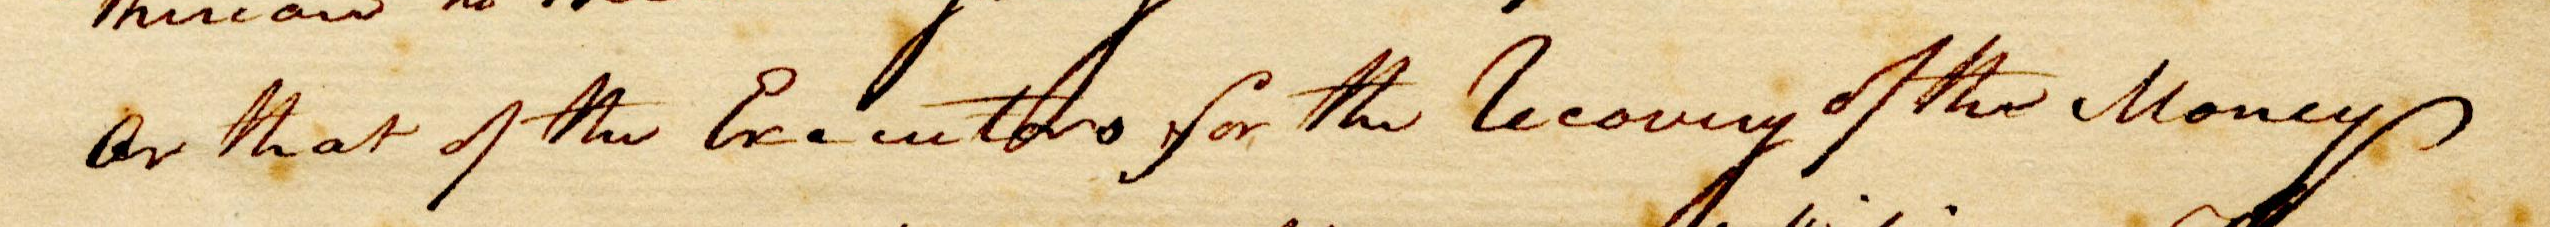as that of the Executor for the recovery of the Money
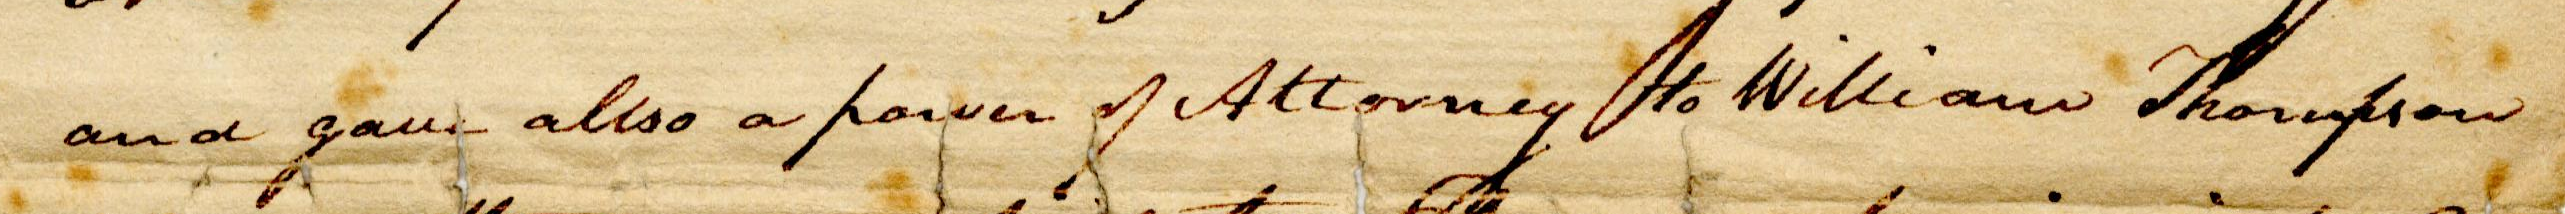and gave also a power of Attorney to William Thompson
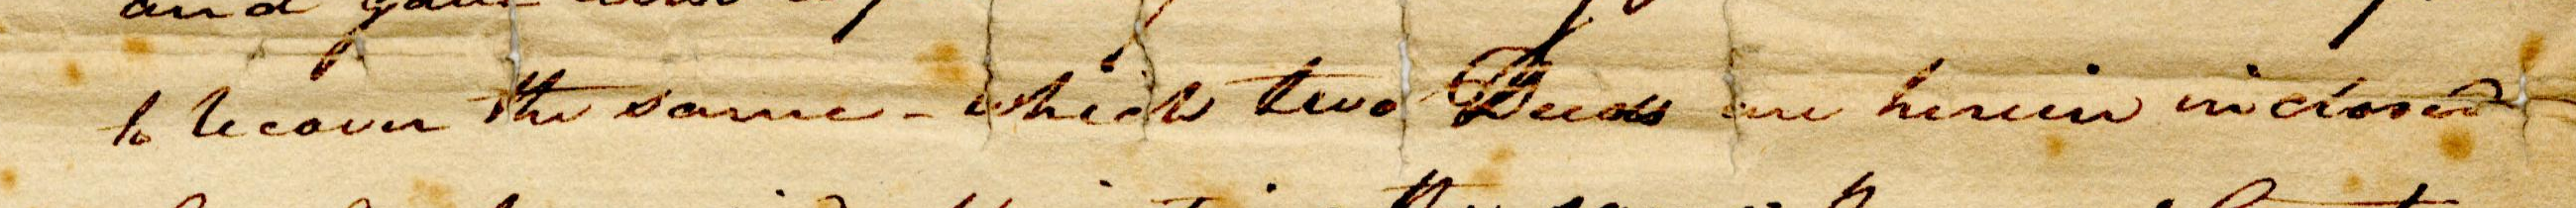to recover the same- which two Deeds are herein inclosed
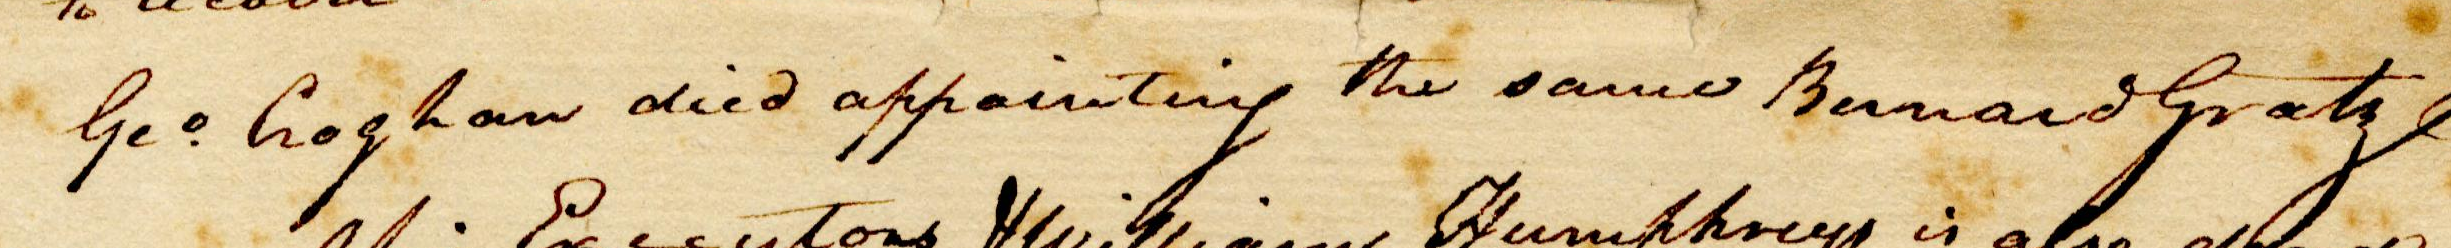Ge^o. Croghan died appointing the same Bernard Gratz
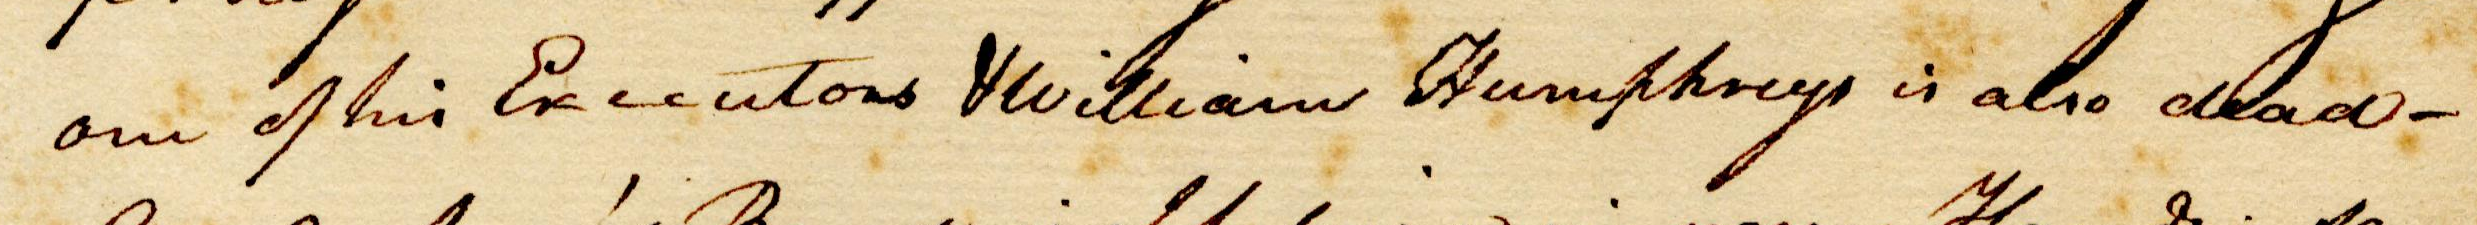one of his Executors & Williain Humphreys is also dead-
